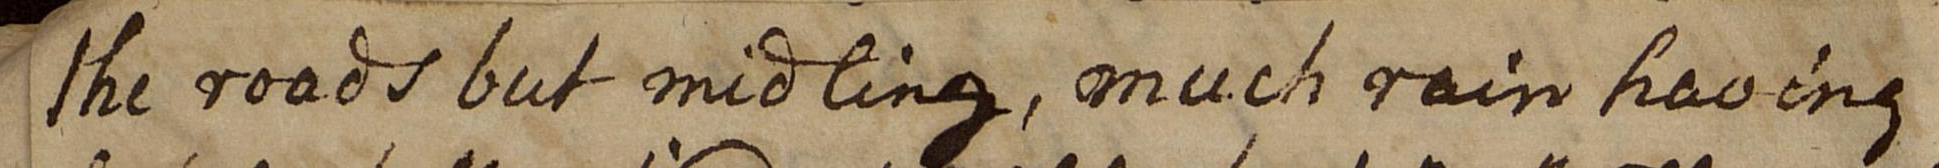the roads but midling, much rain having
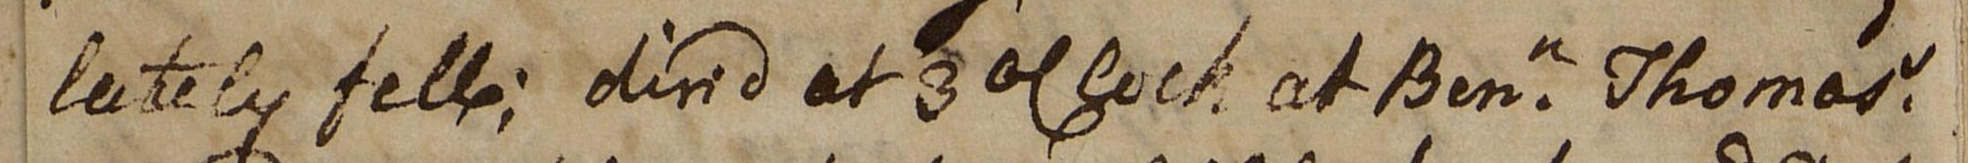lately fell; din'd at 3 ^o Clock at Ben^n. Thomas^s.
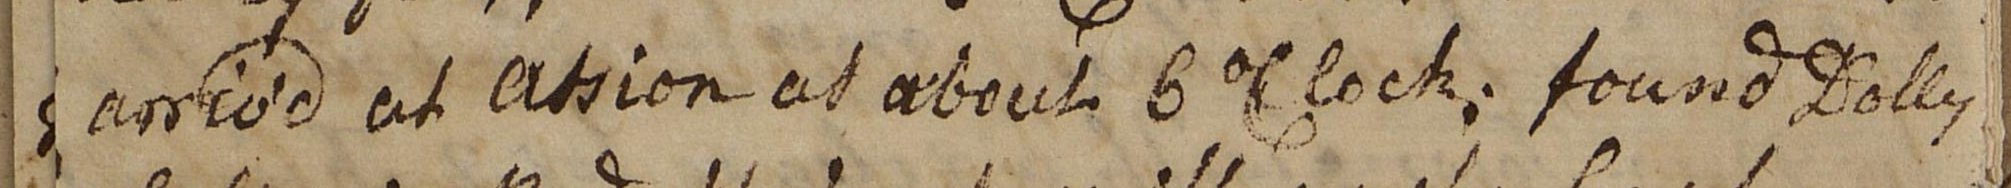arriv'd at Atsion at about 6 ^o Clock; found Dolly
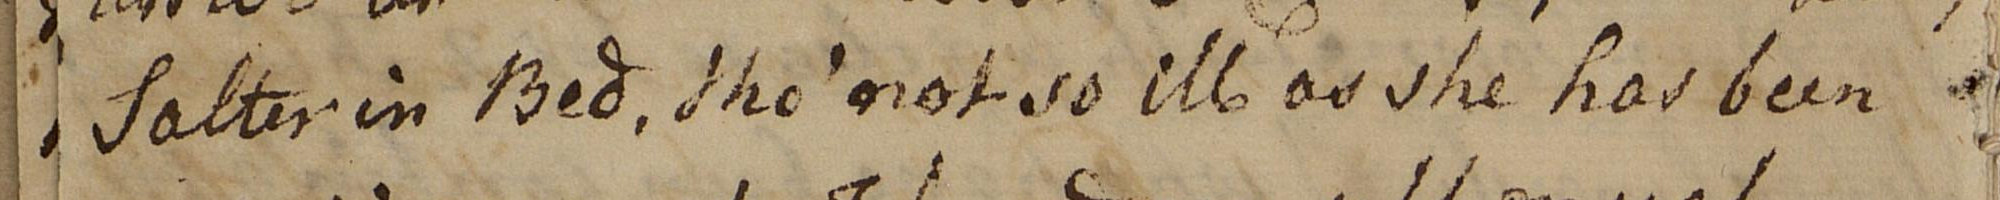Salter in Bed, tho' not so ill as she has been.
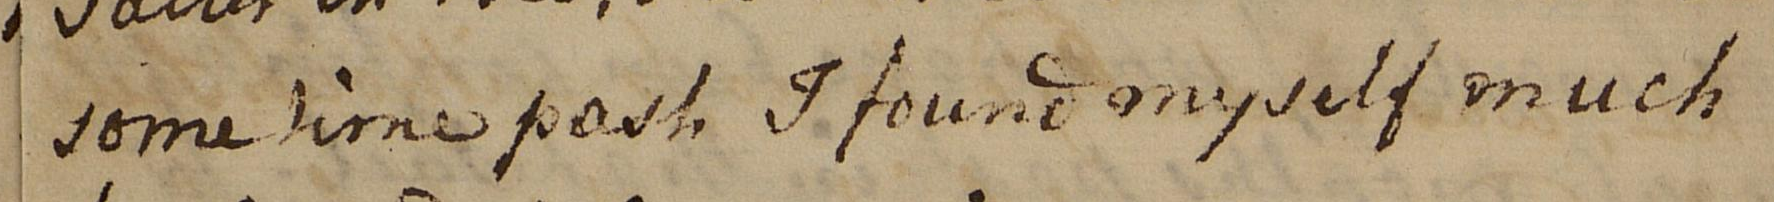sometimes past I found myself much
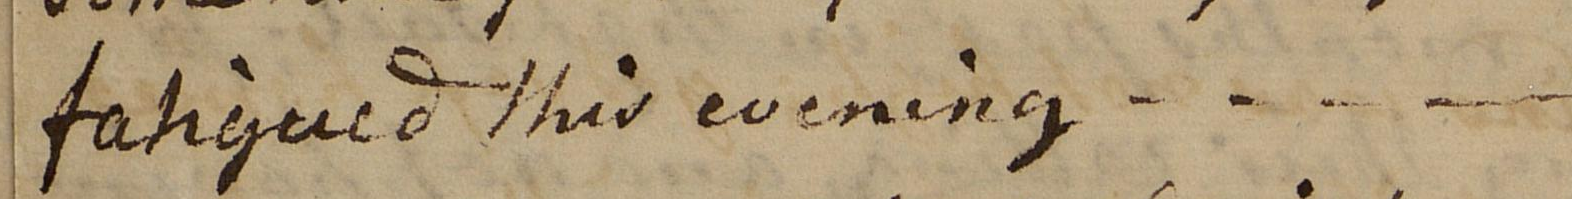fatigued this evening---
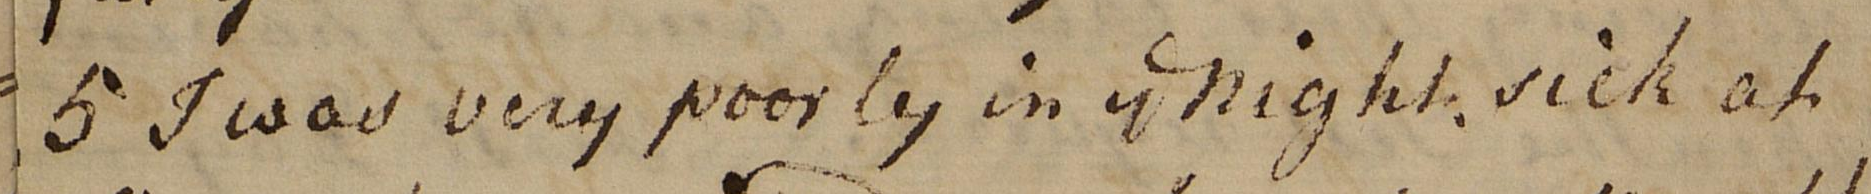5 I was very poorly in y^e night, sick at
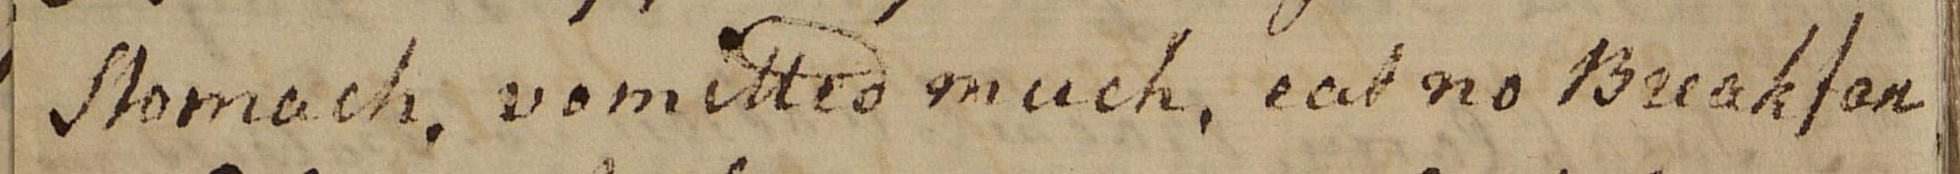Stomach, vomitted much, eat no Breakfan
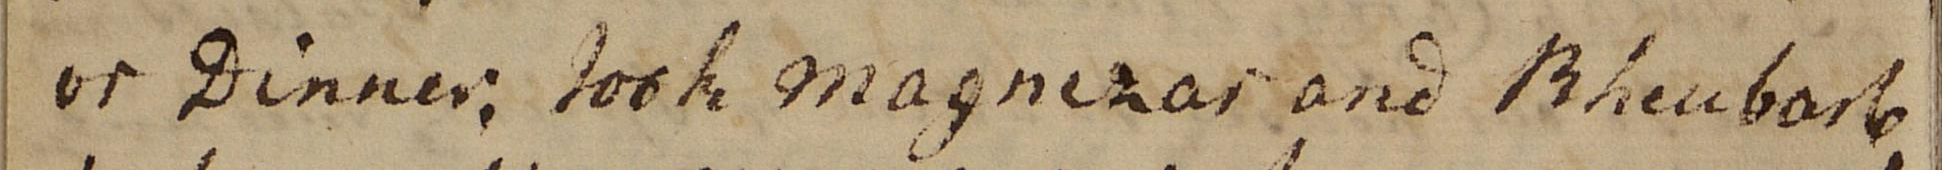or Dinner: took magnezar and Rheubarb,
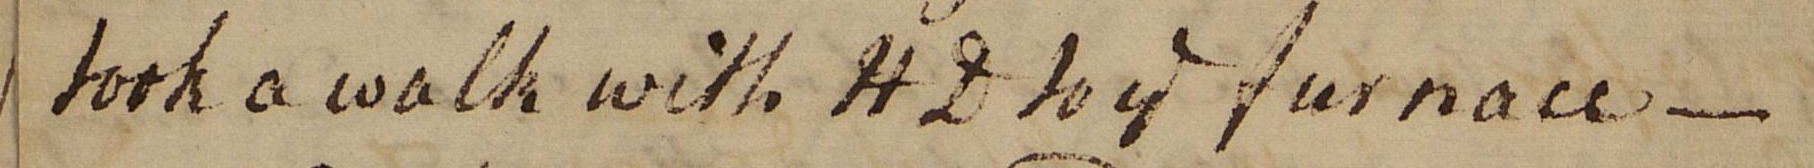tork a walk with HD to y^e furnance-
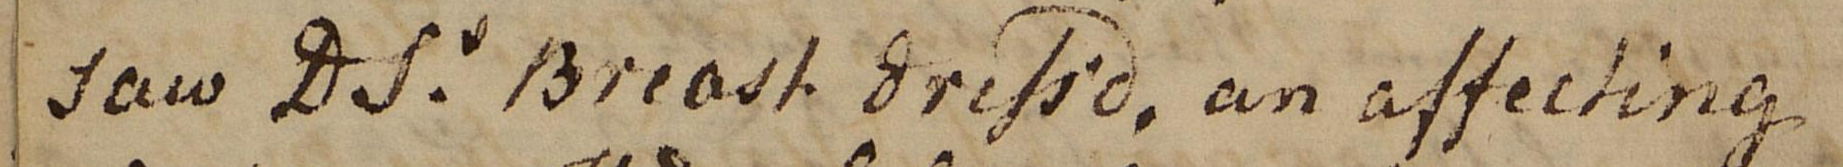saw DS^s. Breast dress'd, an affecting
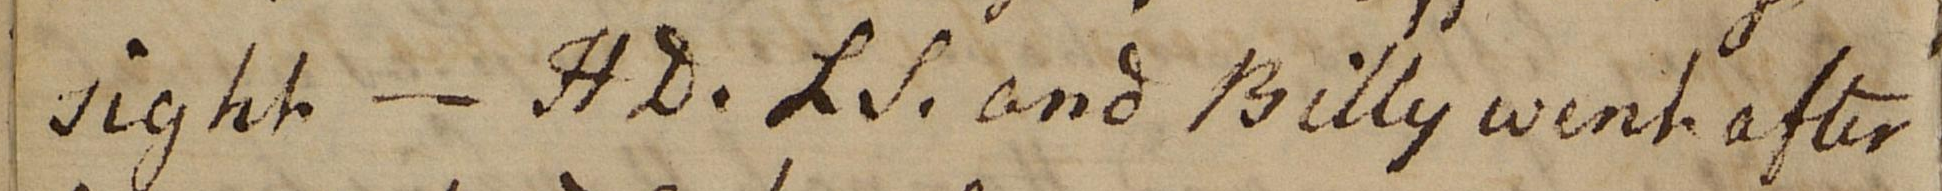sight- HD. LS. and Billy went after
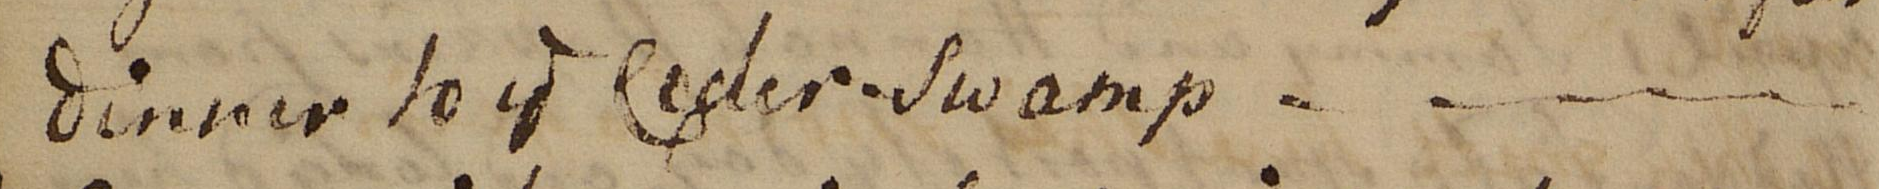dinner to y^e Ceder-Swamp- ---
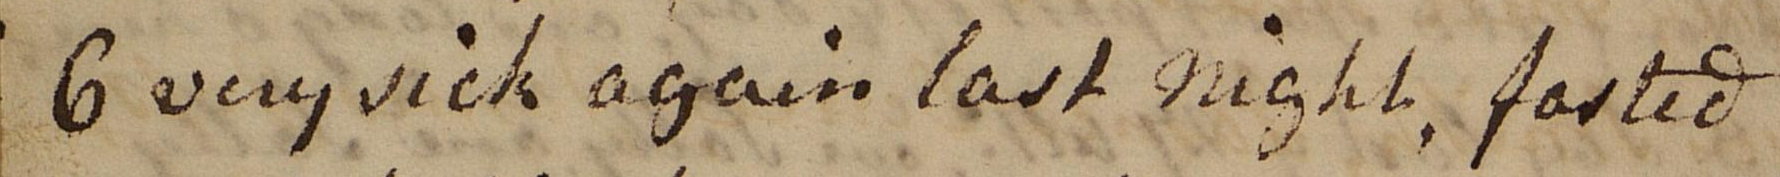6 very sick again last night, fasted
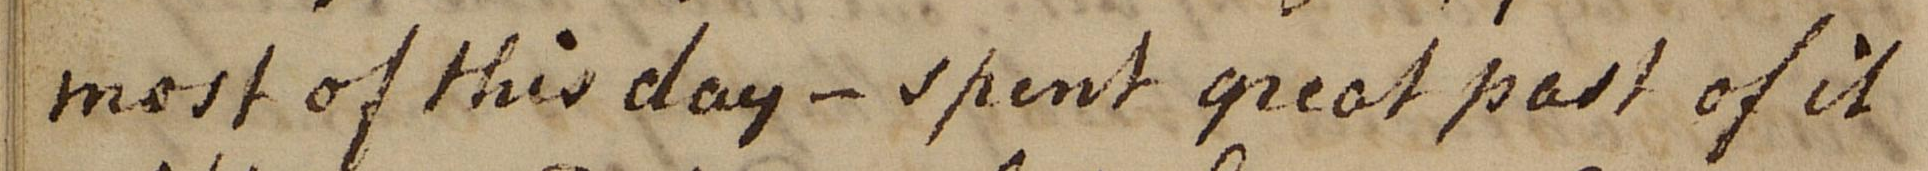most of this day- spent great part of it
